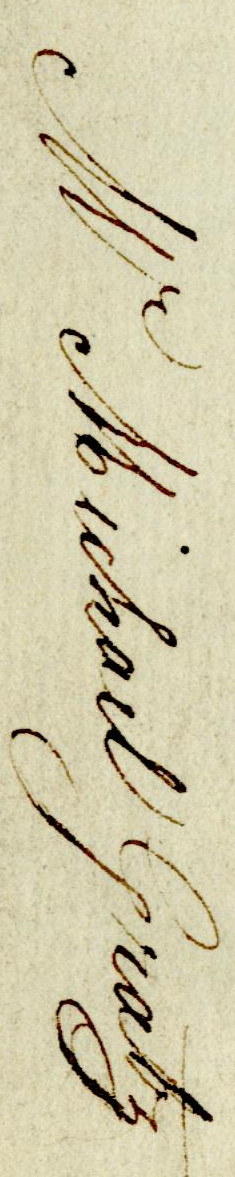M^r Michael Gratz
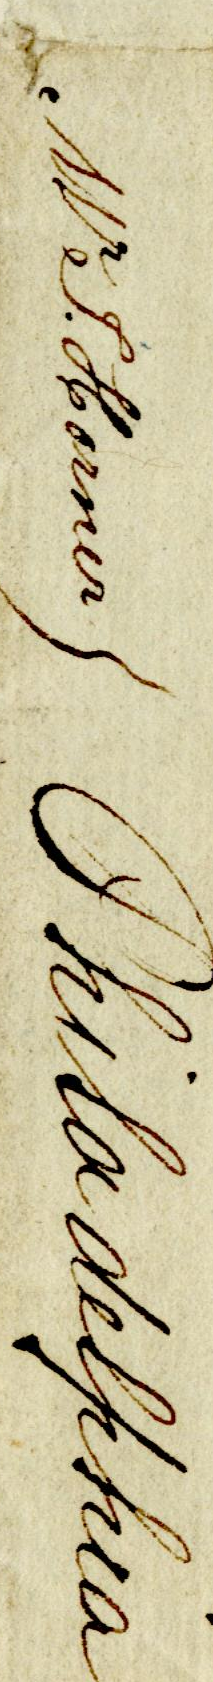M^r J. Horner Philadelphia
